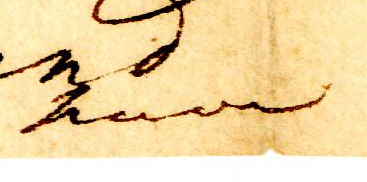have
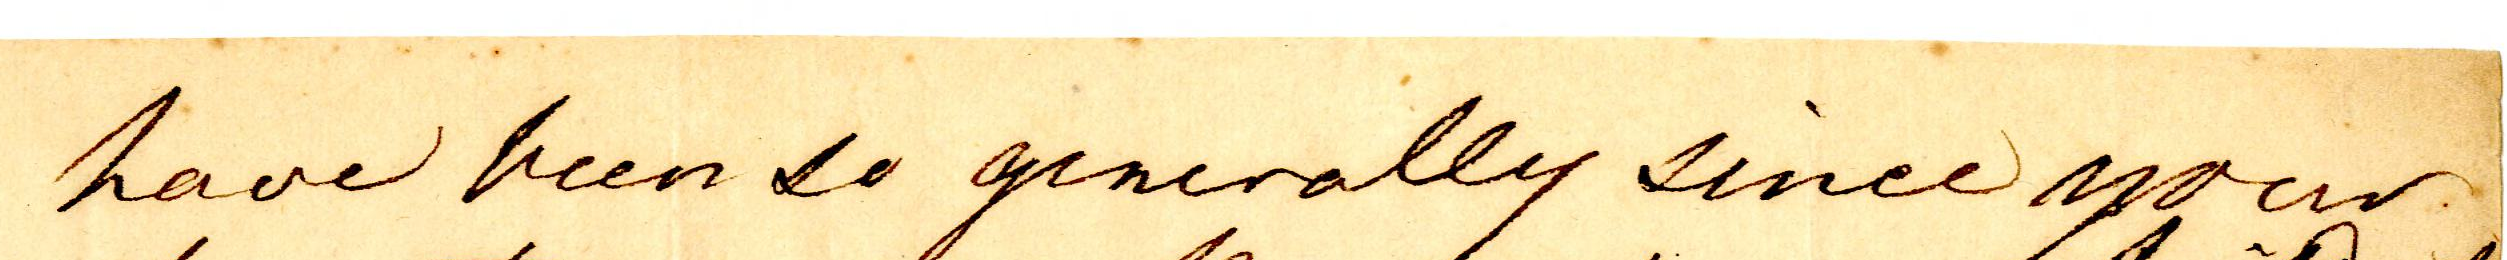have been so generally since your
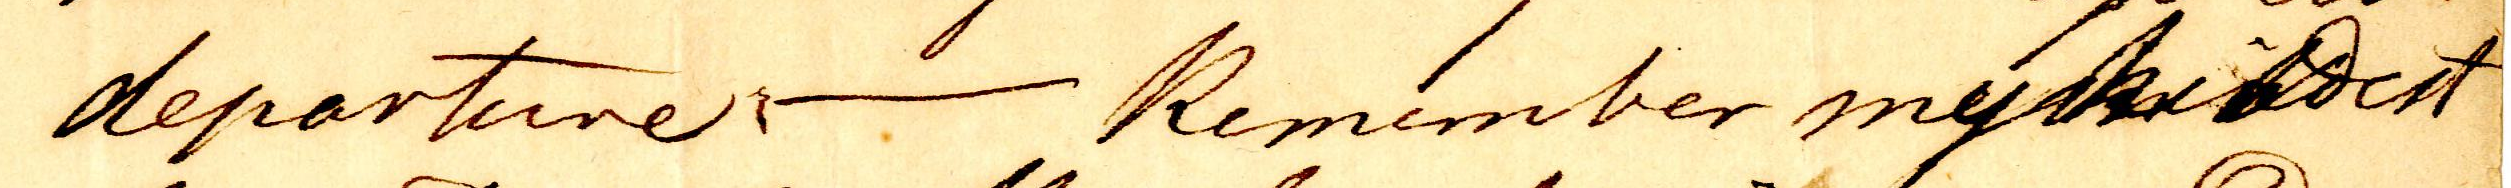departure- Remember my kindest
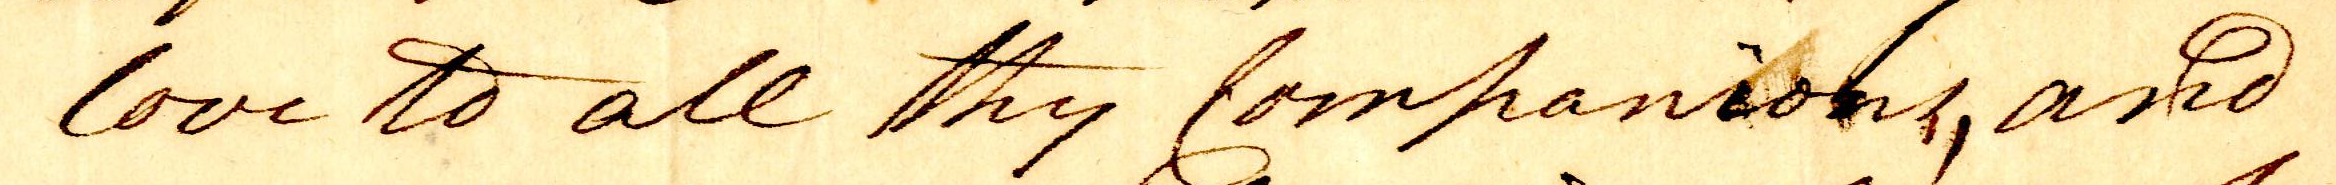love to all thy Companions, and
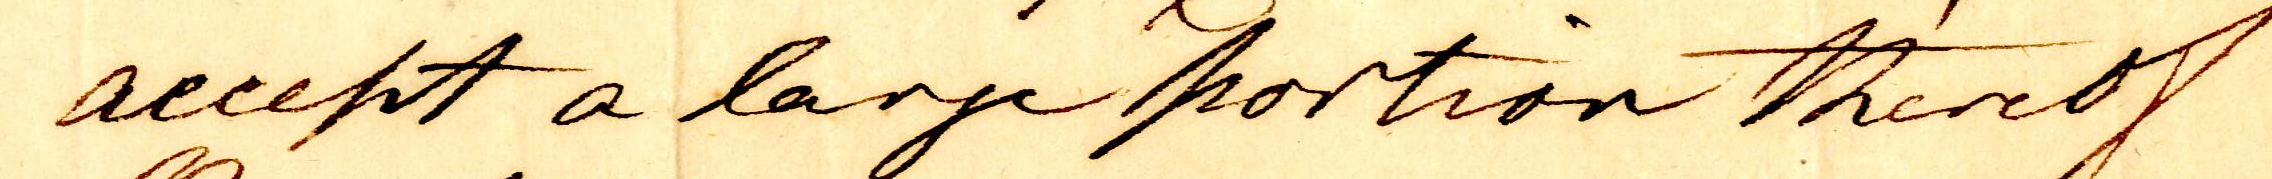accept a large portion thereof
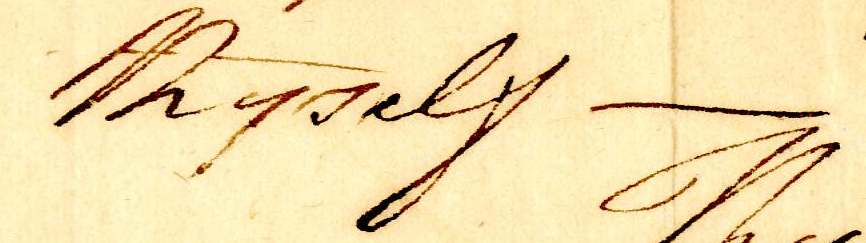thyself-
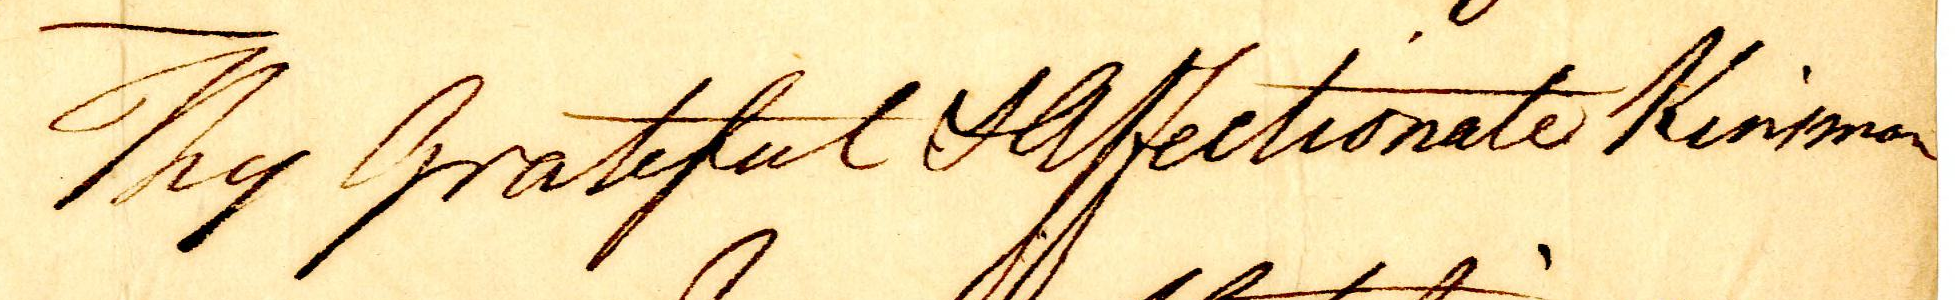Thy Grateful & Affectionate Kinsman
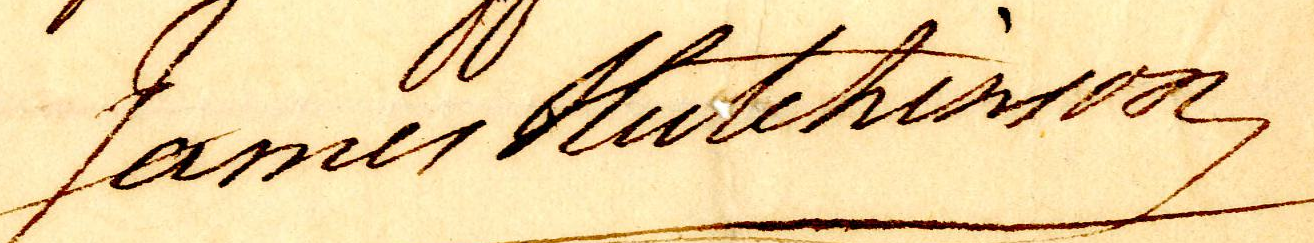James Hutchinson
